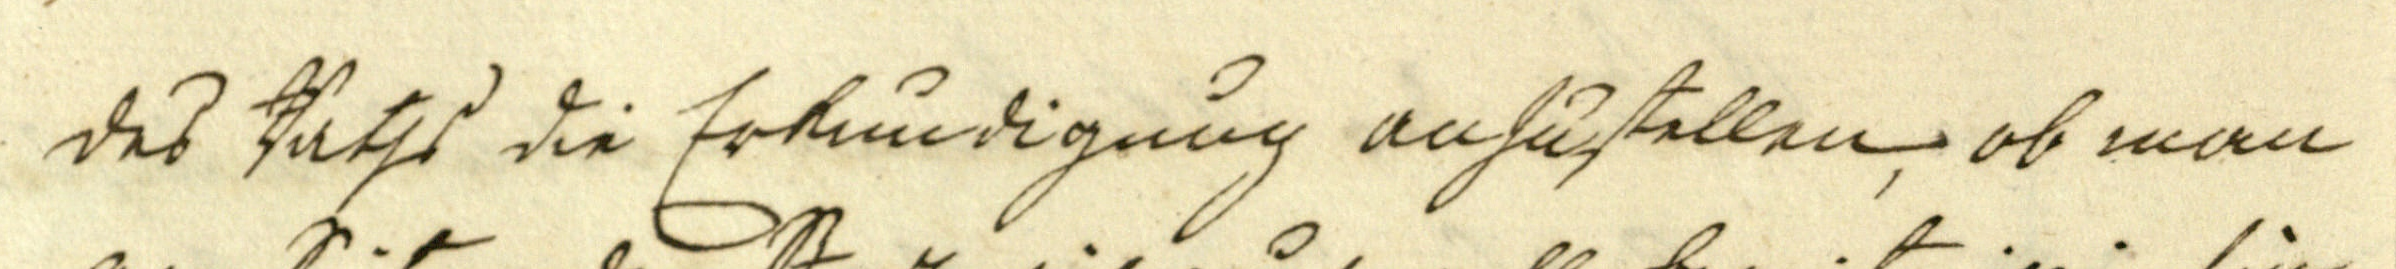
des Raths die Erkundigung anzustellen, ob man
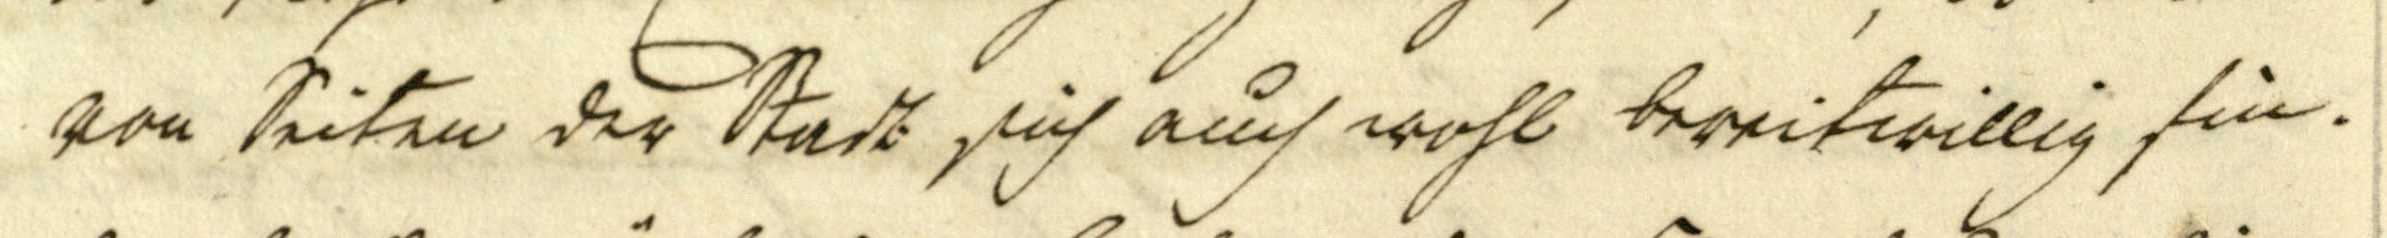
von Seiten der Stadt sich auch wohl bereitwillig fin-
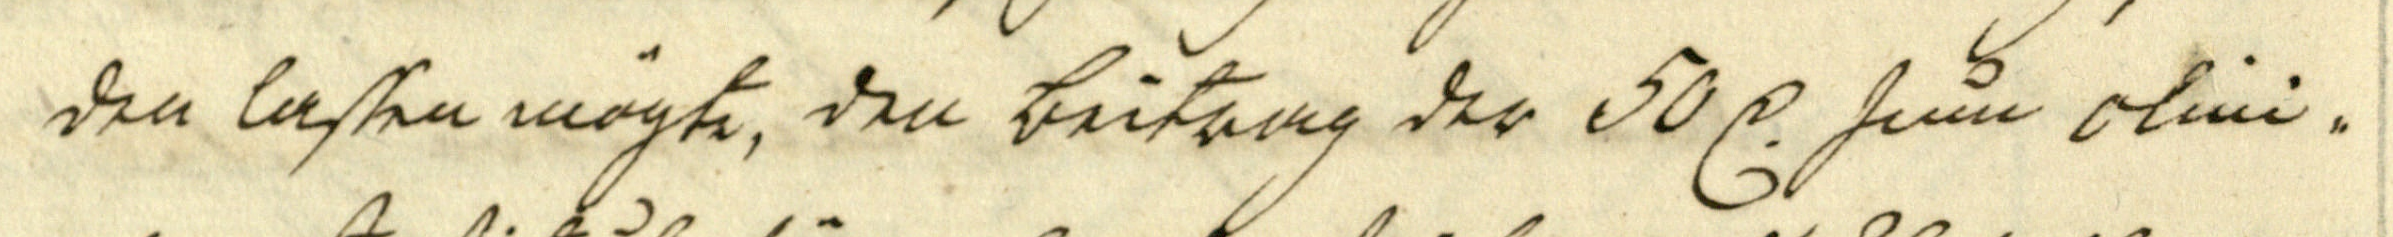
den lassen mögte, den Beitrag der 50 l. zum clini¬
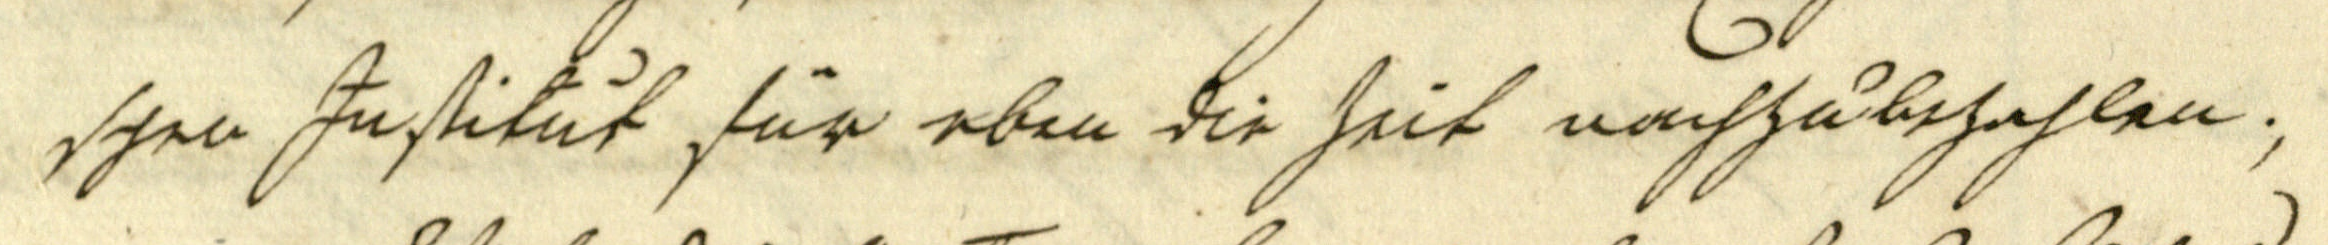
chen Institut für eben die Zeit nachzubezahlen;
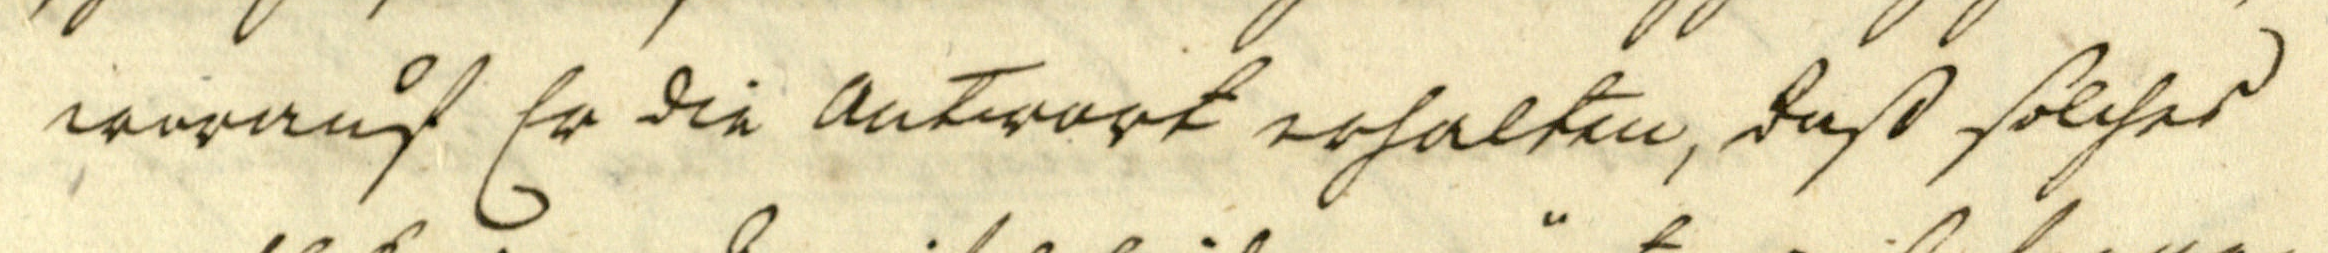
worauf Er die Antwort erhalten, daß solches
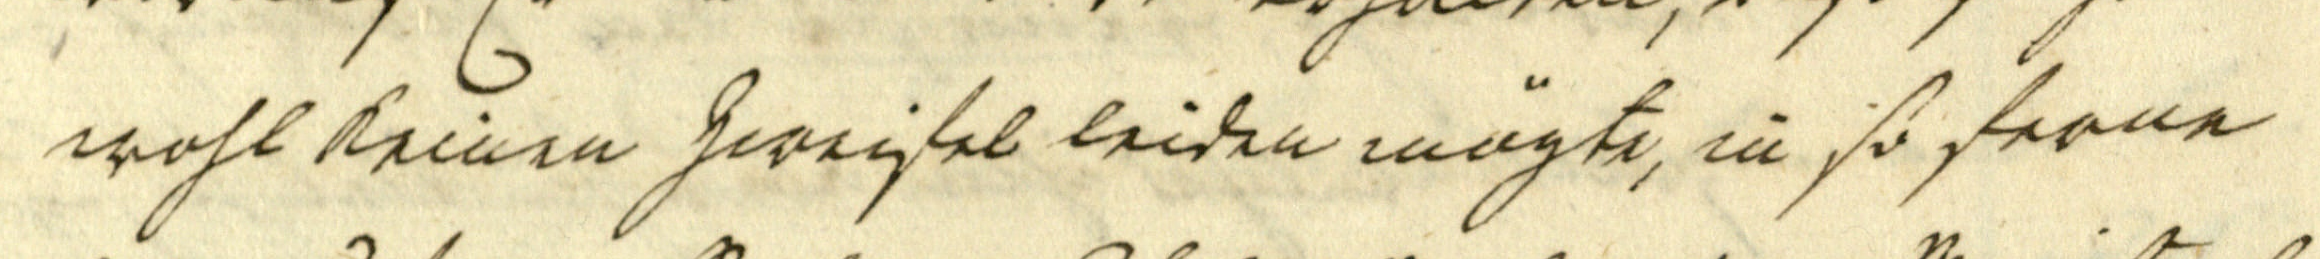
wohl keinen Zweifel leiden mögte, in so ferne
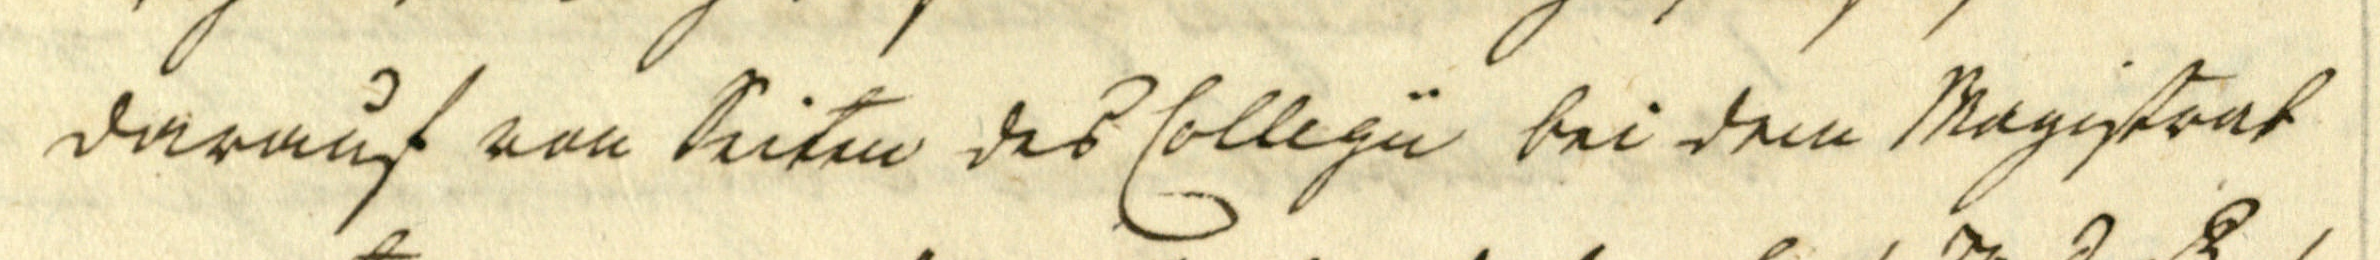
darauf von Seiten des Collegii bei dem Magistrat
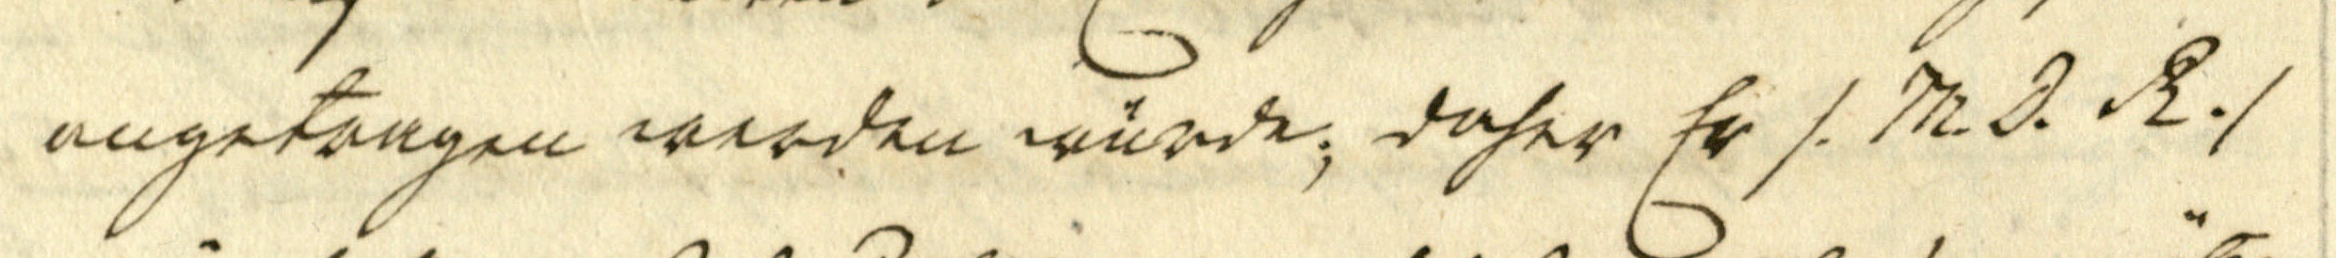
angetragen werden würde, daher Er /. M. D. R./
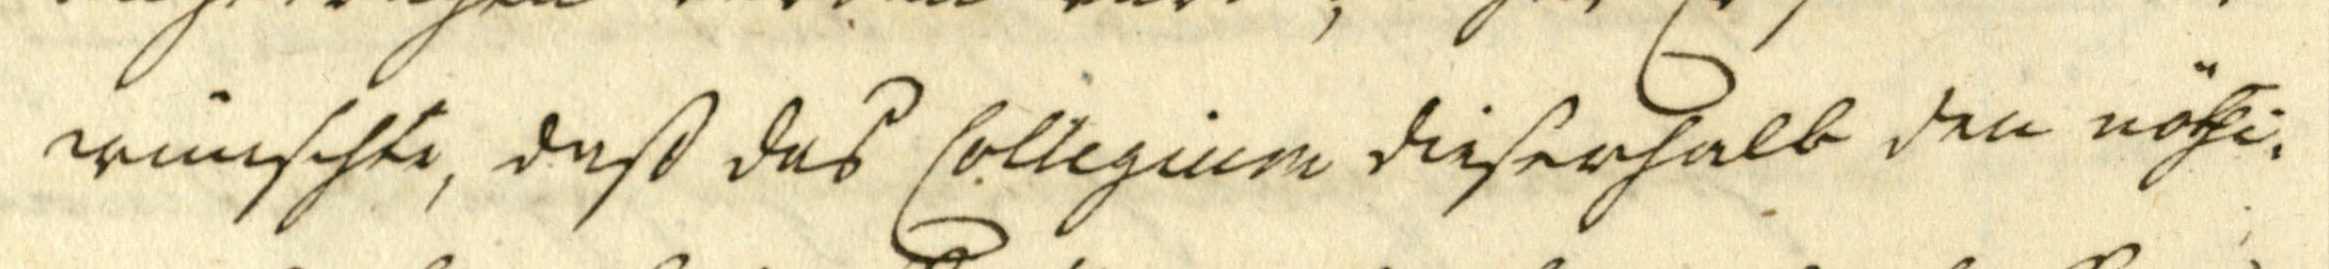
wünschte, daß das Collegium dieserhalb den nöthi¬
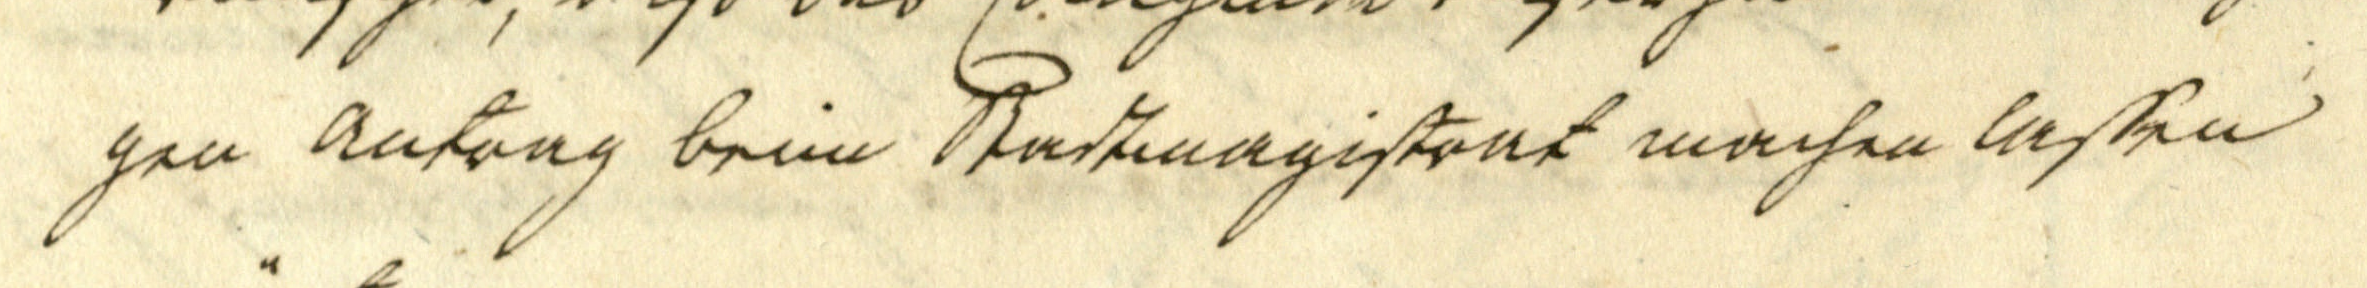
gen Antrag beim Stadtmagistrat machen lassen
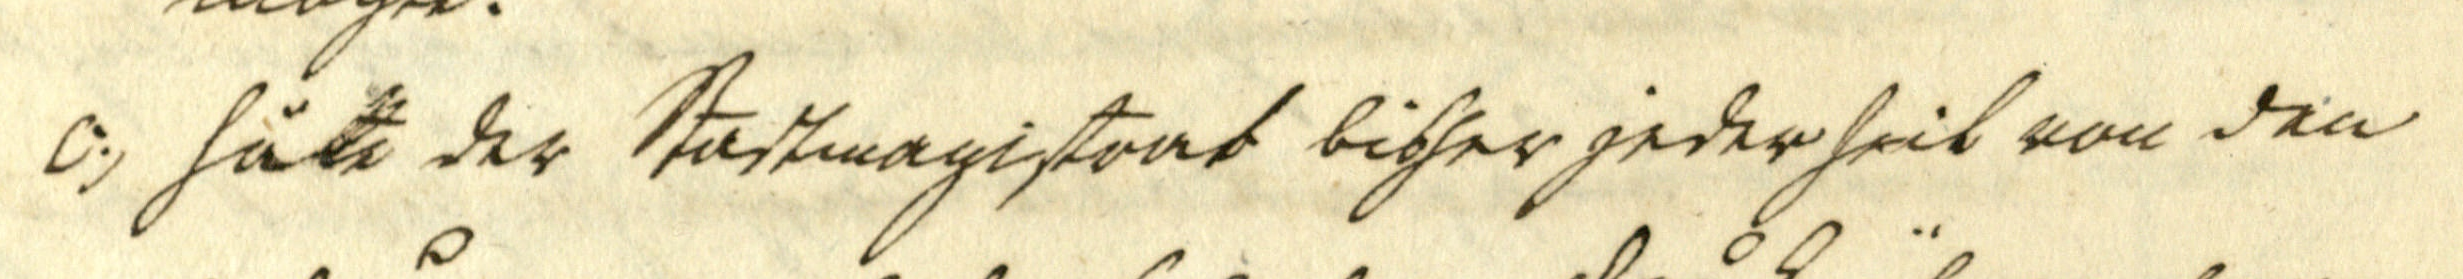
c., hätte der Stadtmagistrat bisher jederzeit von den
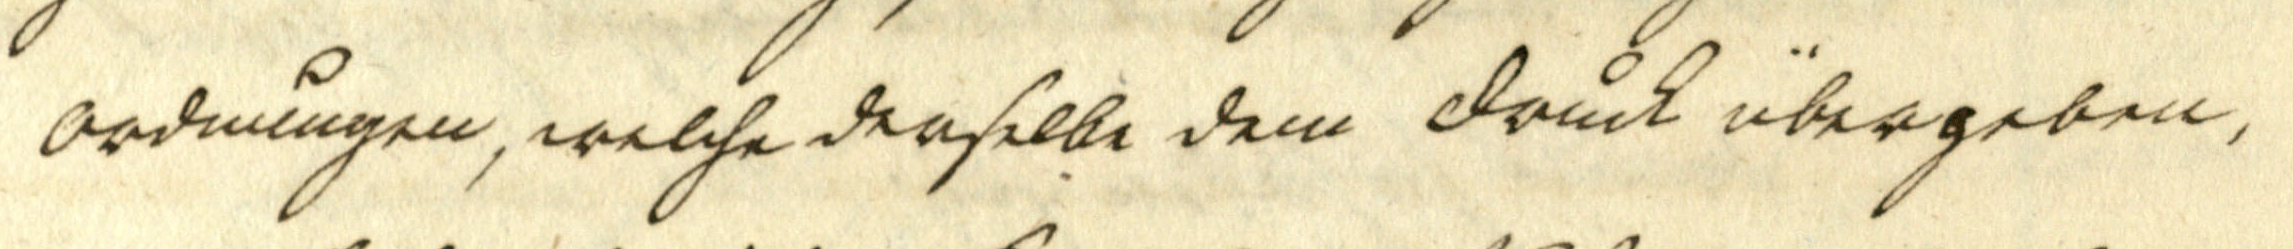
Ordnungen, welche derselbe dem Druck übergeben,
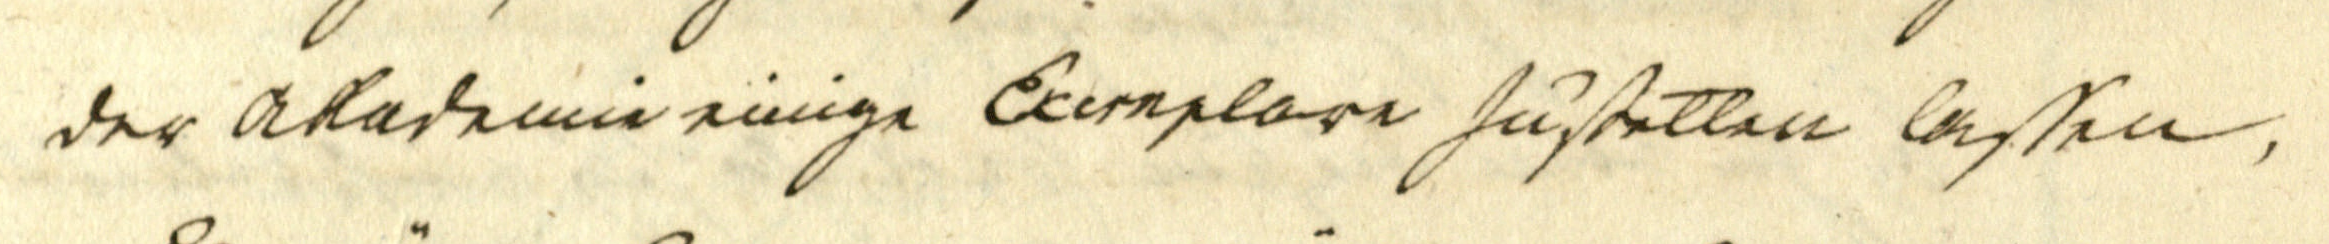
der Akademie einige Exemplare zustellen lassen,
